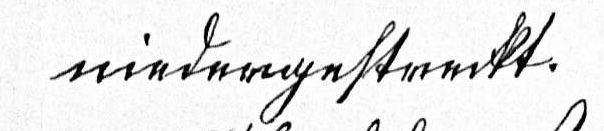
niedergestreckt.
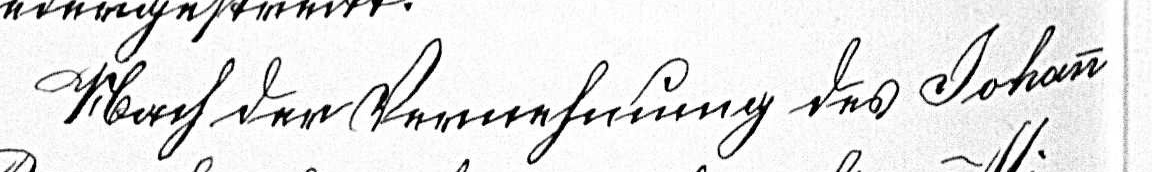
Nach der Vernehmung des Johann
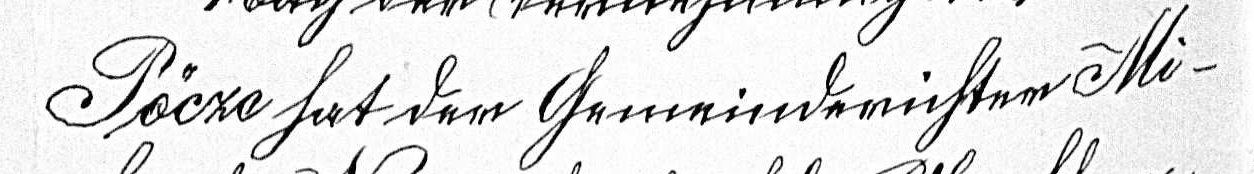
Pöcze hat der Gemeinderichter Mi¬
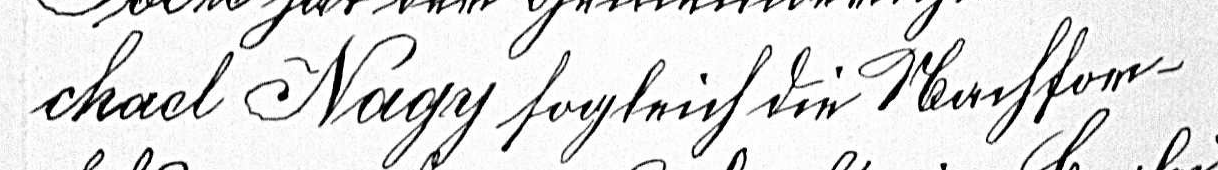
chael Nagy sogleich die Nachfor¬
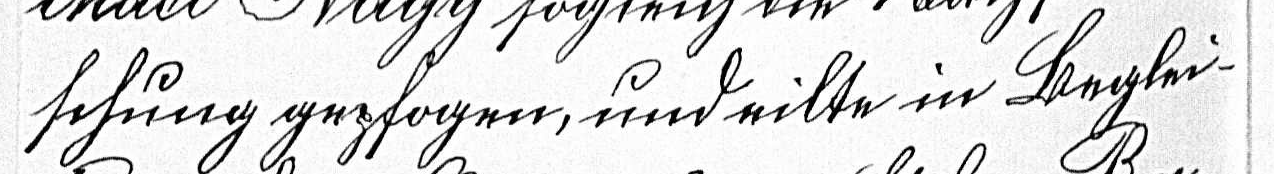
schung gepfogen, und eilte in Beglei¬
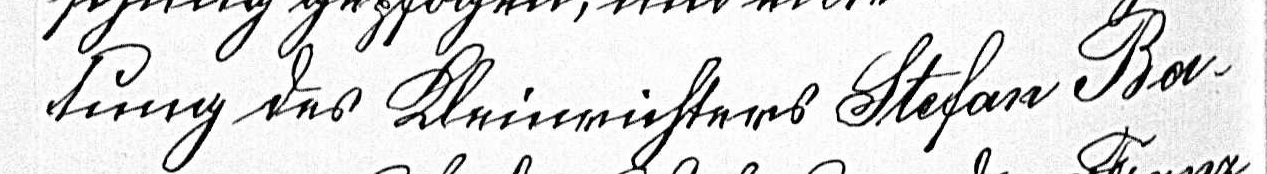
tung des Kleinrichters Stefan Ba¬
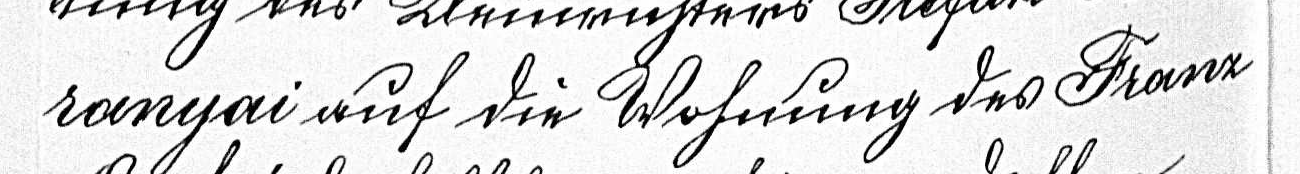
ranyai auf die Wohnung des Franz
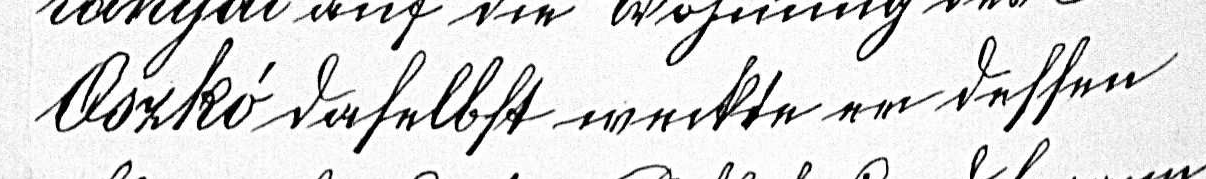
Oszkó daselbst weckte er dessen
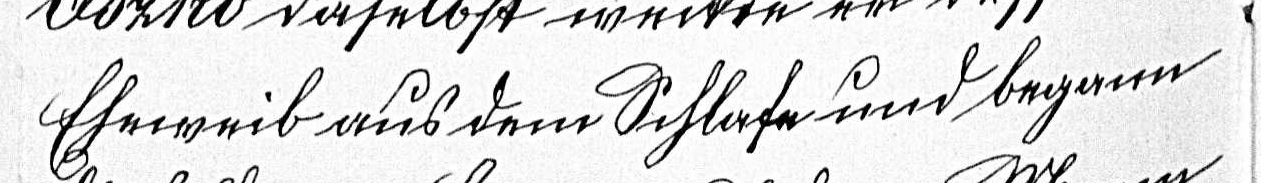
Eheweib aus dem Schlafe und began
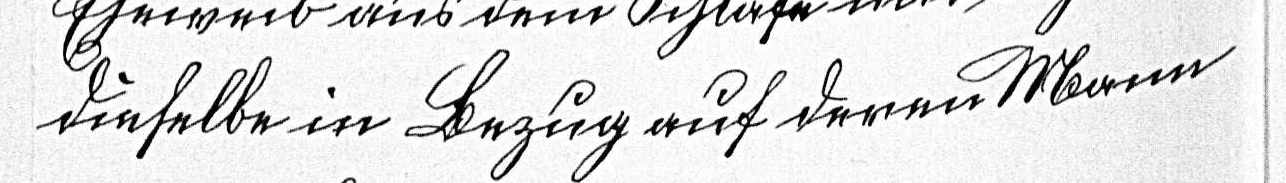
dieselbe in Bezug auf deren Mann
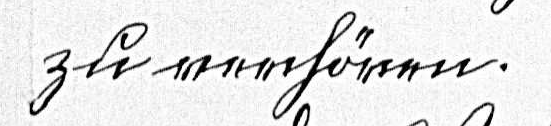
zu verhören.
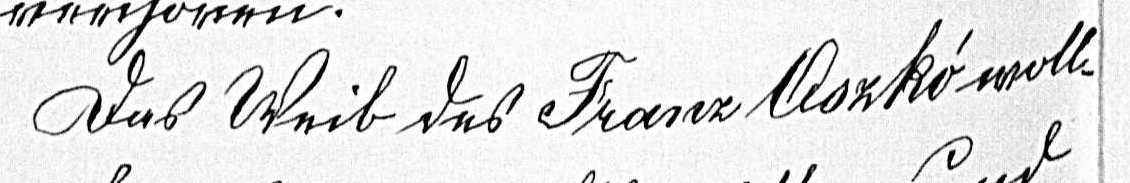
Das Weib des Franz Oszkó woll¬
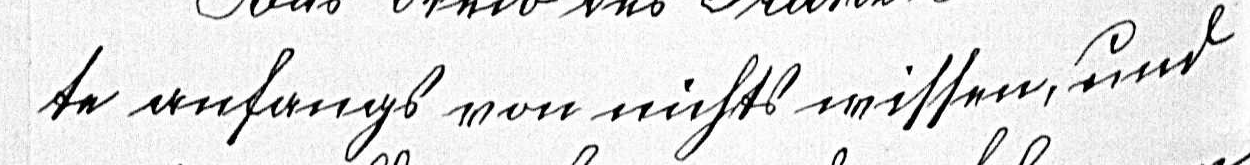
te anfangs von nichts wissen, und
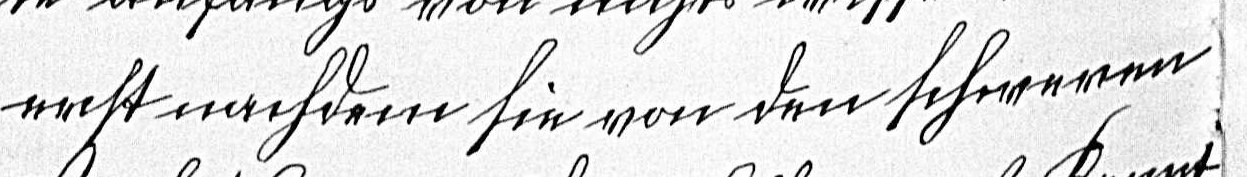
erst nachdem sie von den schweren
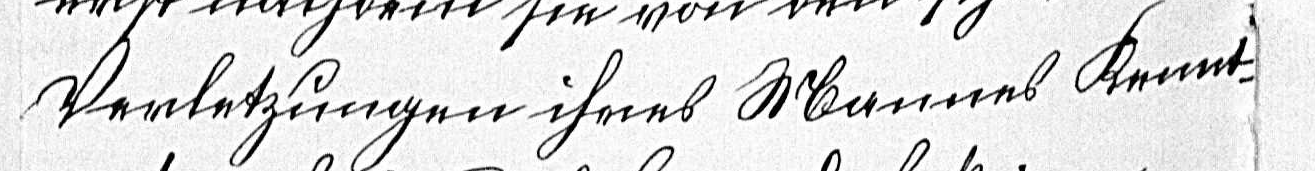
Verletzungen ihres Mannes Kennt¬
